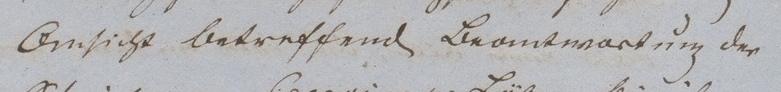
Ansicht betreffend Beantwortung der
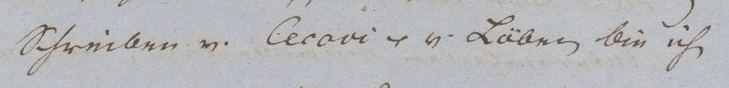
Schriften v. Cerovi & v. Löben bin ich
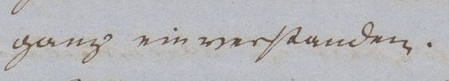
ganz einverstanden.
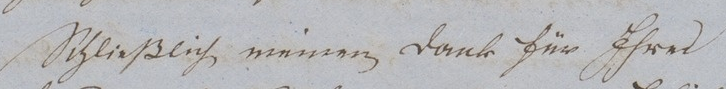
Schließlich meinen Dank für Ihre
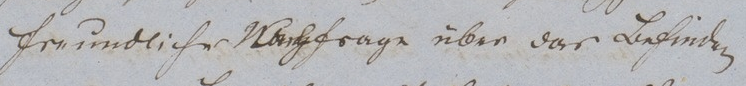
freundliche Nachfrage über das Befinden
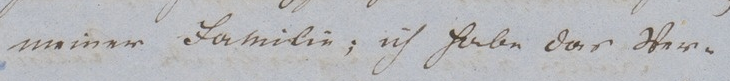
meiner Familie; ich habe das Ver-
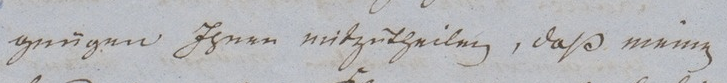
gnügen Ihnen mitzutheilen, daß meine
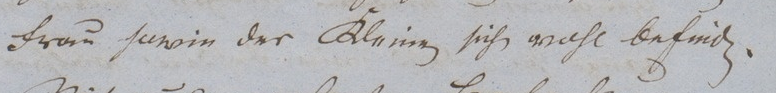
Frau sowie der Kleine sich wohl befinden.
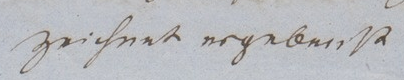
zeichnet ergebenst
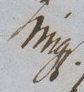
J.
